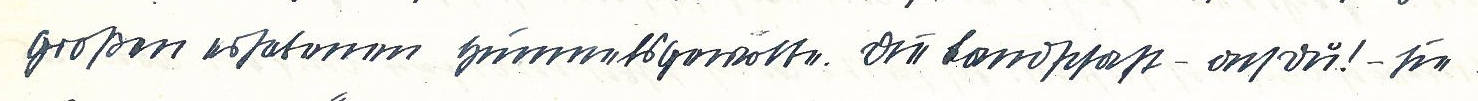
großen erhabenen Himmelsgewölbe. Die Landschaft – ach Du! – sie
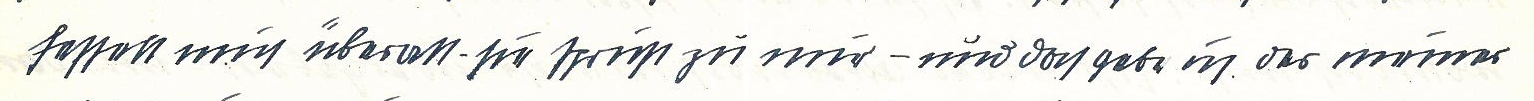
fesselt mich überall – sie spricht zu mir – und doch gebe ich meiner
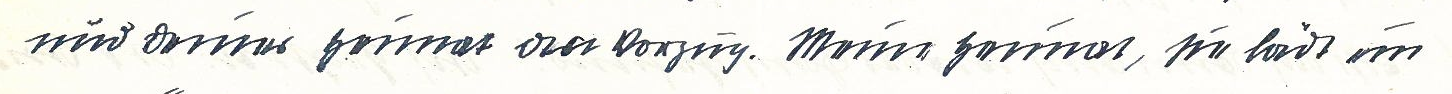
vor Deiner Heimat den Vorzug. Meine Heimat, sie lädt ein
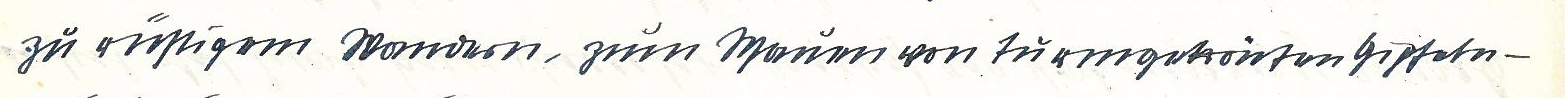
zu rüstigem Wander, zum Schauen von turmgekrönten Gipfeln –
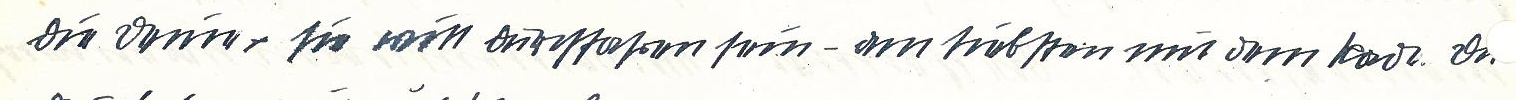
die Deine, sie will durchfahren sein – am liebsten mit dem Rade. Du
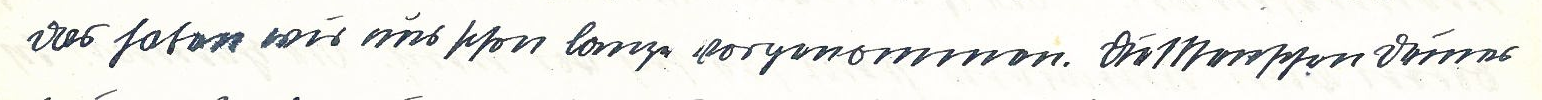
das haben wir uns schon lange vorgenommen. Die Menschen Deiner
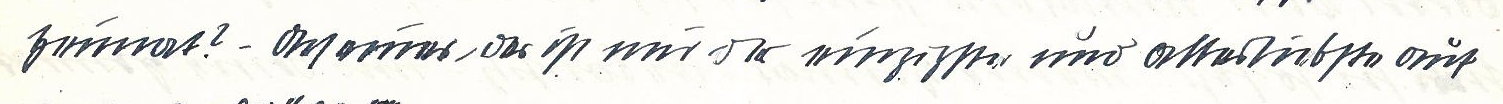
Heimat? – Ach einer er ist mir der einzigste und allerliebste auf
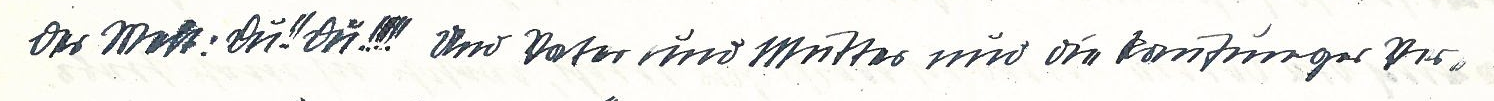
der Welt Du!! Du!!! Und Vater und Mutter und die K.er Ver¬
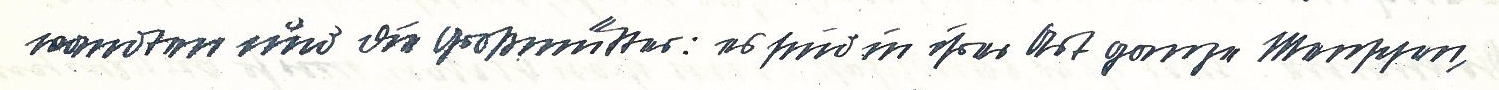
wandten und die Großmütter: es sind in ihrer Art ganze Menschen,
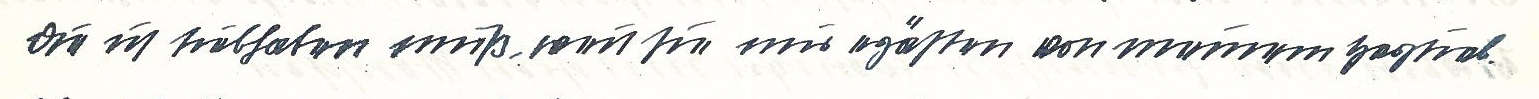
die ich lieb haben muß, weil sie mir erzählen von meinem Herzlieb.
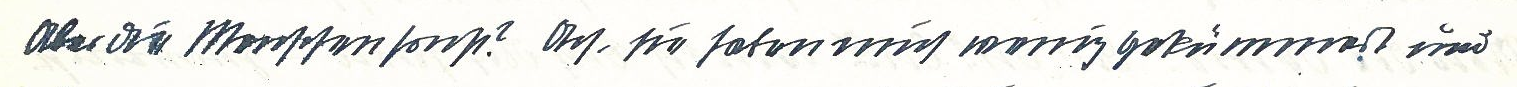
Aber die Menschen sonst? Ach, sie haben mich wenig bekümmert und
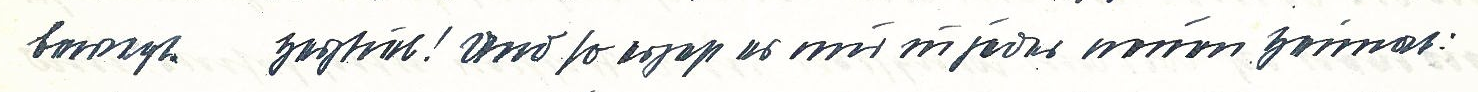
bewegt. Herzlieb! So ergeht es mir in jeder neuen Heimat:
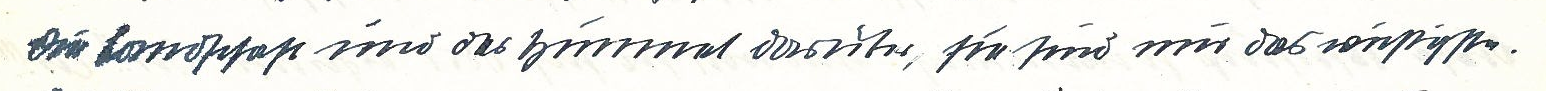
Die Landschaft und der Himmel darüber, sie sind mir das Wichtigste.
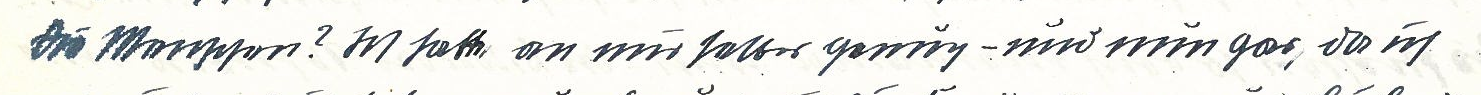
Die Menschen? Ich hatte an mir selber genug – und nun gar, da ich
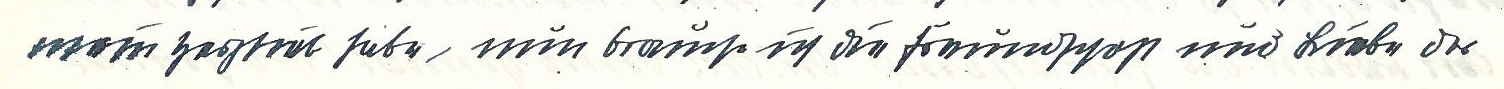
mein Herzlieb liebe, nun brauche ich die Freundschaft und Liebe der
